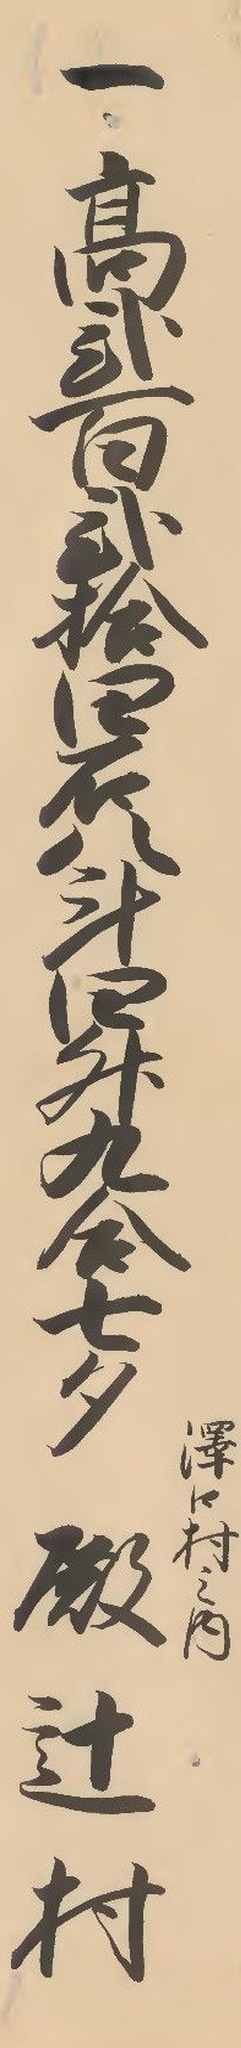一高弐百弐拾四石八斗四升九合七勺殿辻村
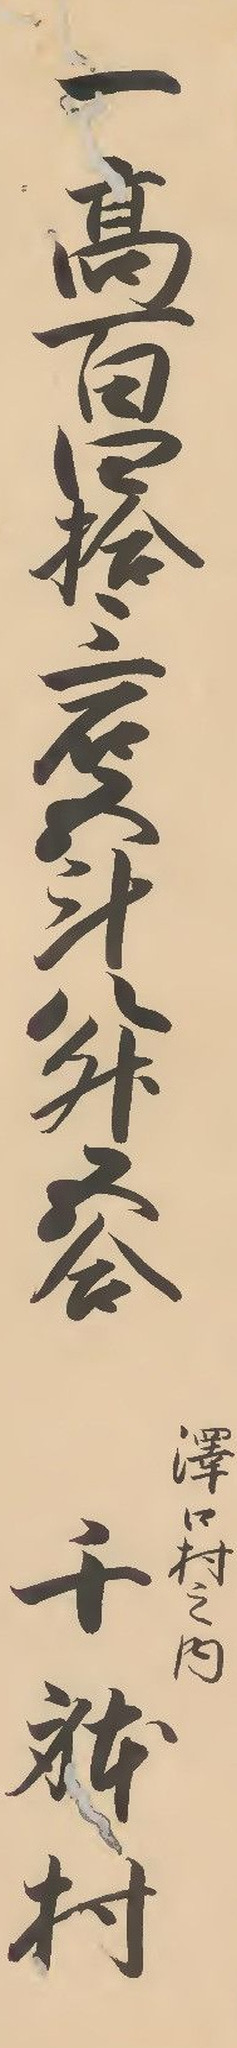一高百四拾三石五斗八升五合千体村
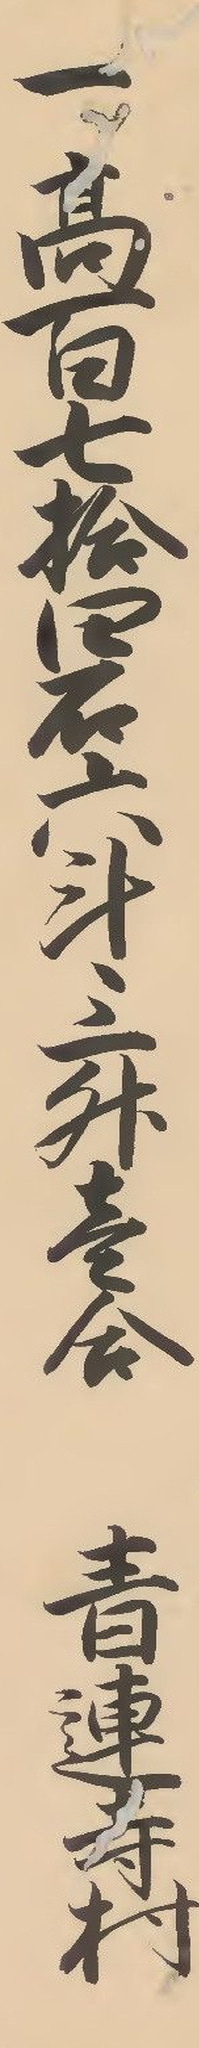一高百七拾四石六斗三升壱合青連寺村
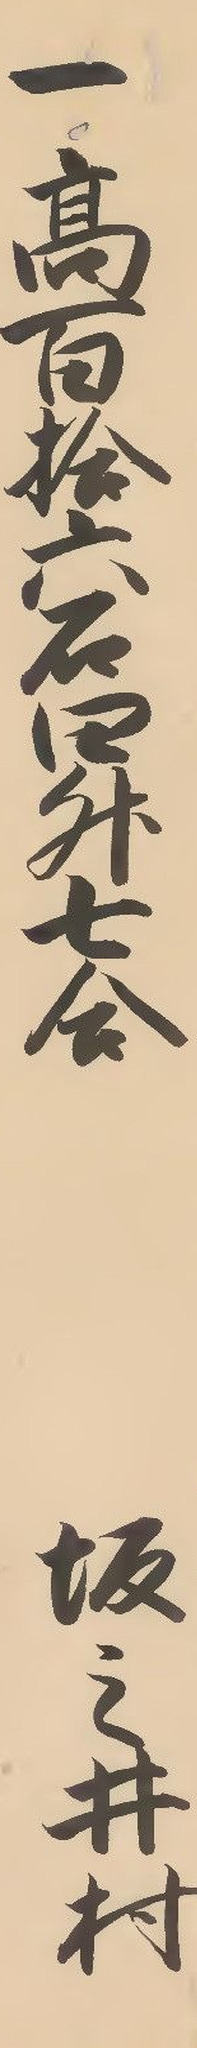一高百拾六石四升七合坂之井村
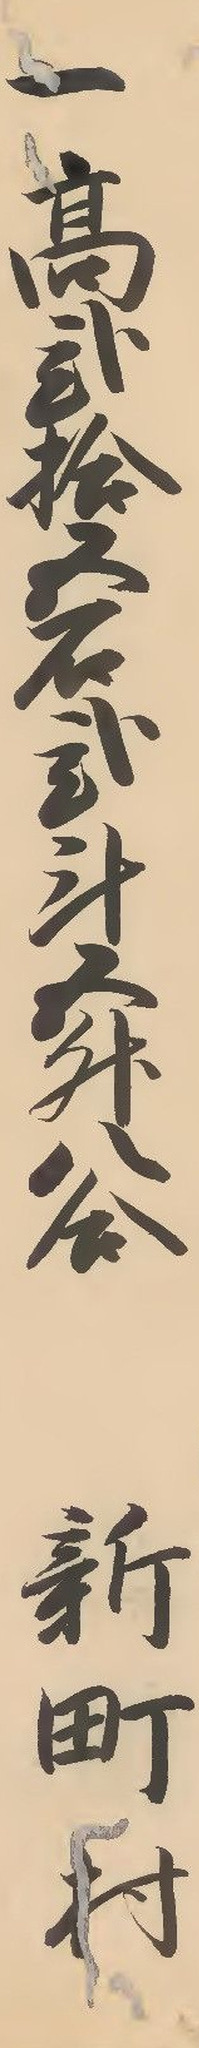一高弐拾五石弐斗五升八合新町村
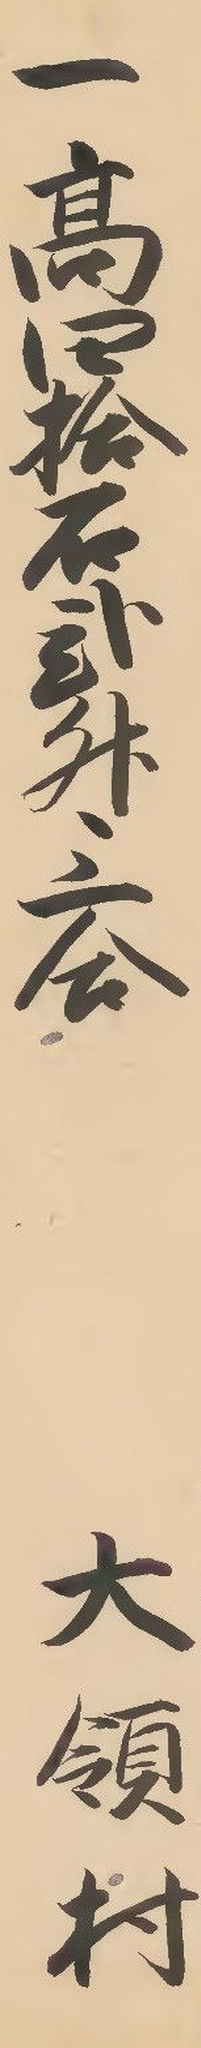一高四拾石弐升三合大領村

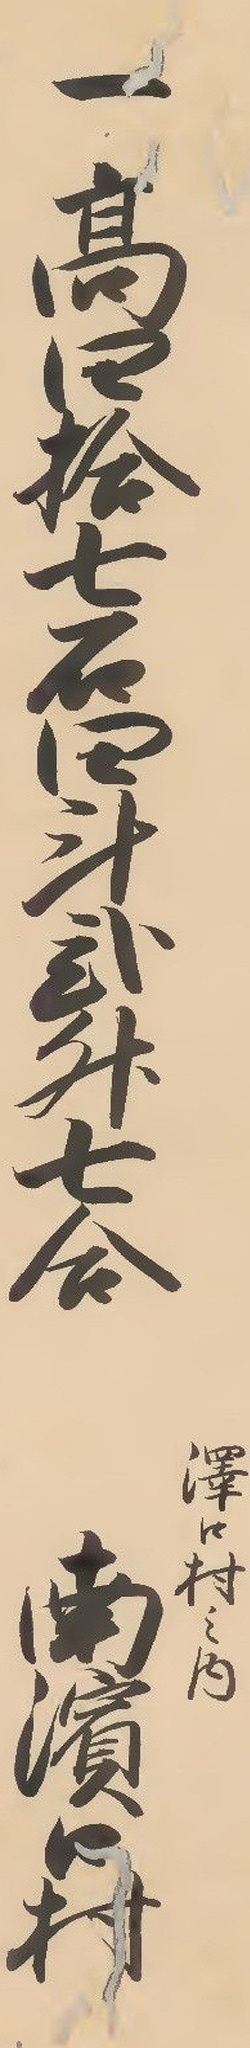一高四拾七石四斗弐升七合南浜口村
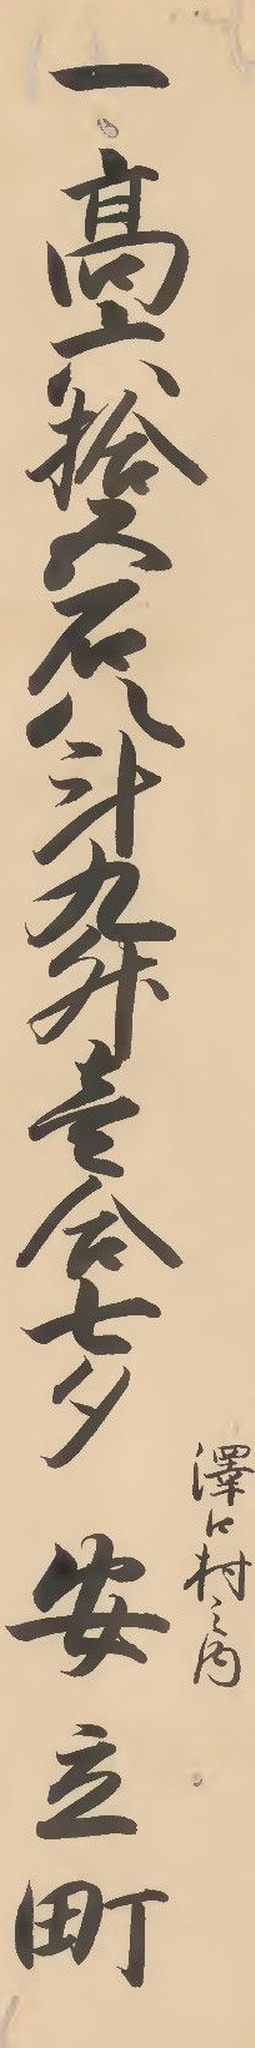一高六拾五石八斗九升壱合七勺安立町
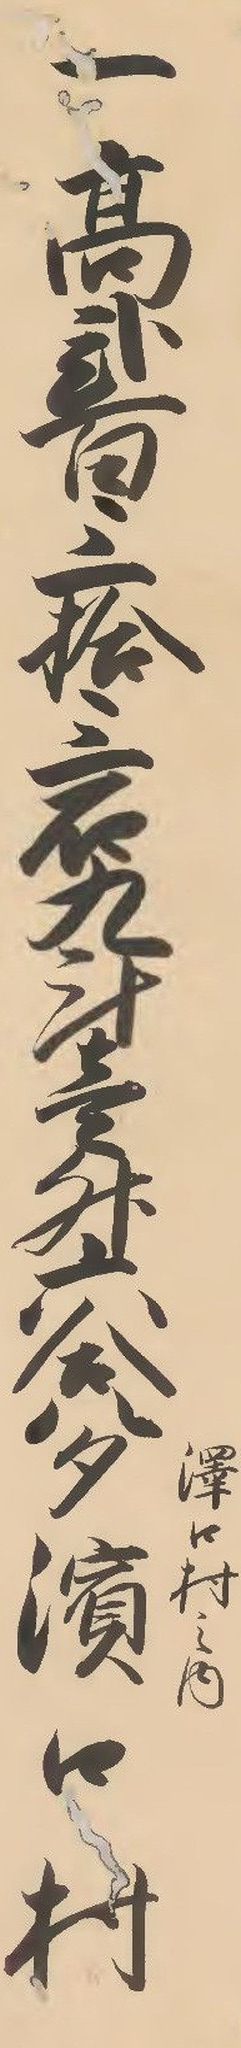一高弐百三拾三石九斗壱升六合八勺浜口村
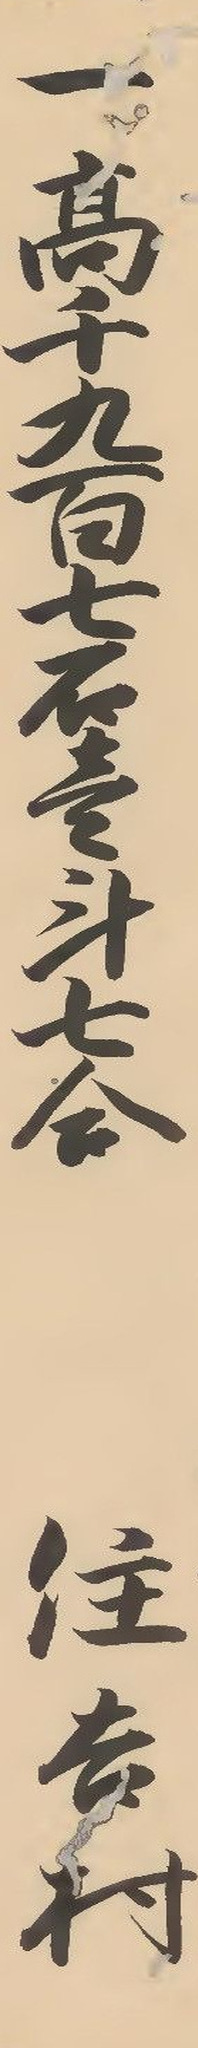一高千九百七石壱斗七合住吉村
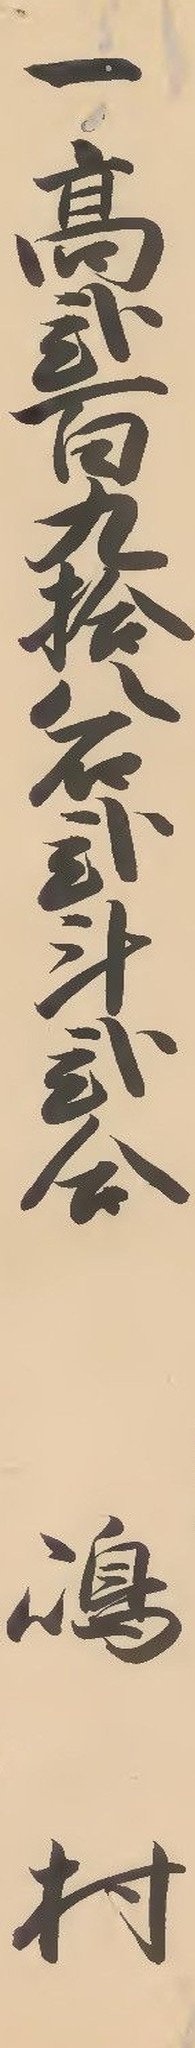一高弐百九拾八石弐斗弐合島村
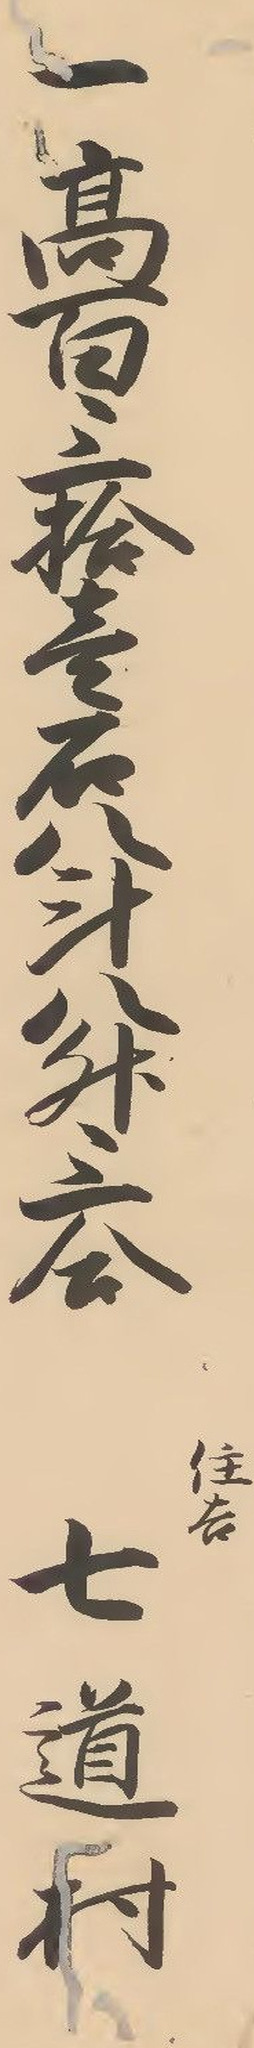一高百三拾壱石八斗八升三合七道村
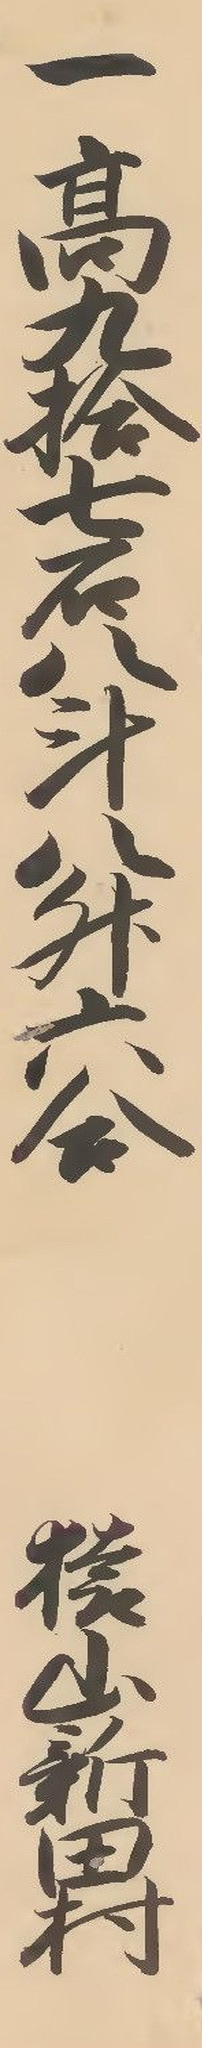一高九拾七石八斗八升六合猿山新田村

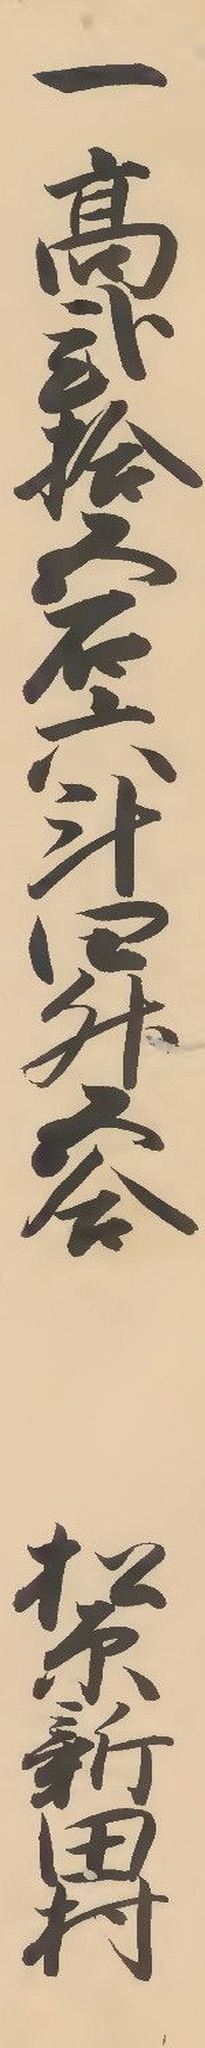一高弐拾五石六斗四升五合松原新田村
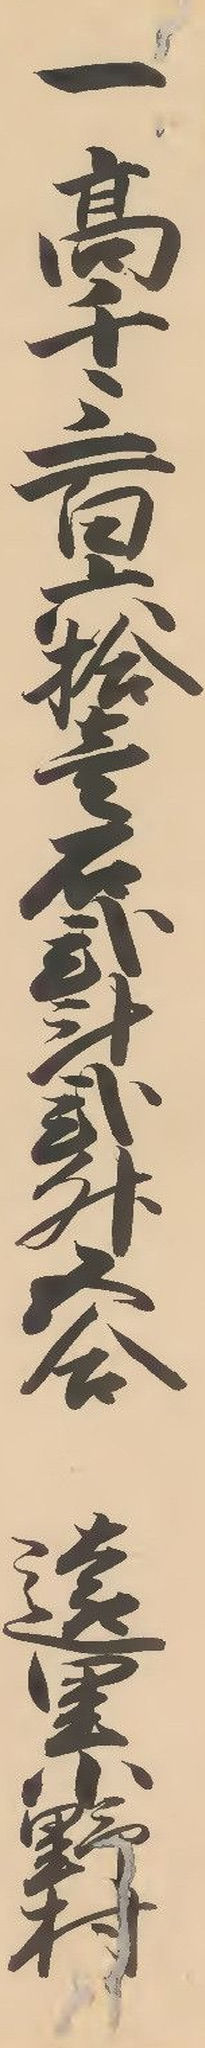一高千三百六拾壱石弐斗弐升五合遠里小野村
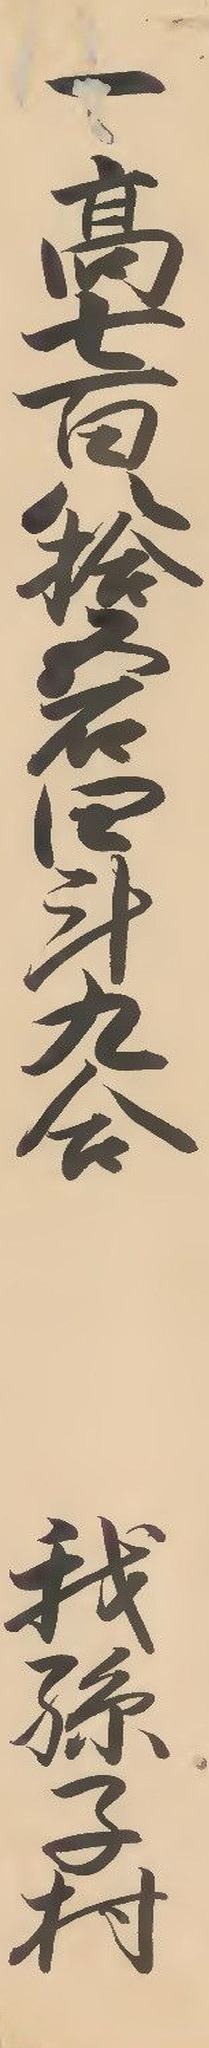一高七百八拾五石四斗九合我孫子村
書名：摂津国郷帳
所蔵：国立公文書館 National Archives of Japan
